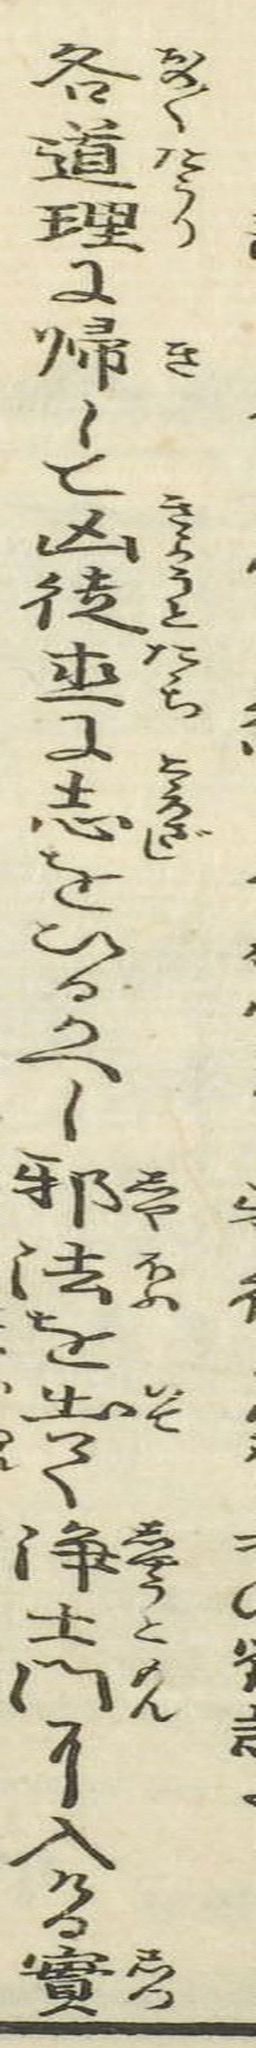各道理に帰して凶徒直に志をひるかへし邪法を出て浄土門に入ける実
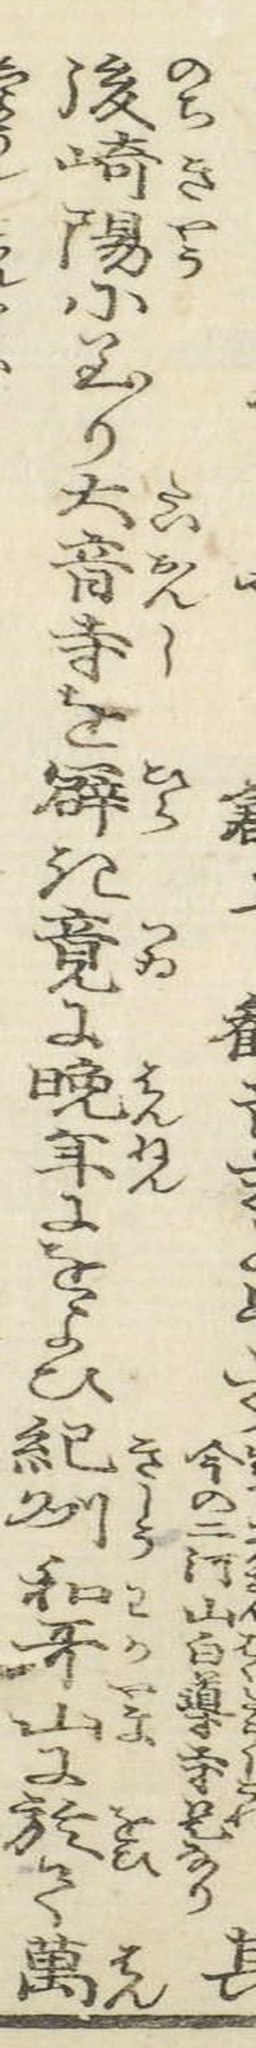後崎陽に至り大音寺を闢き竟に晩年にをよひ紀州和歌山に於て万
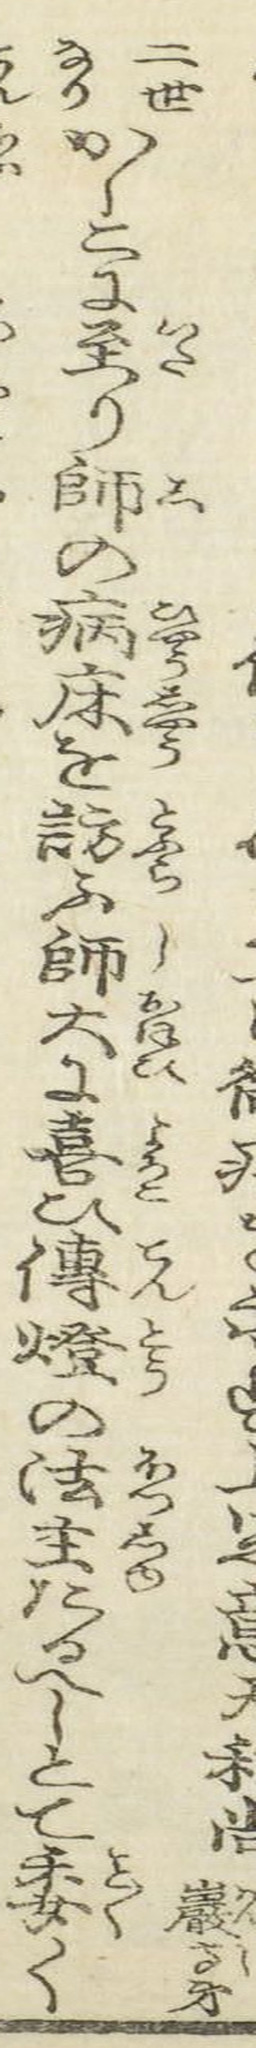二世なりかしこに至り師の病床を訪ふ師大に喜ひ伝燈の法主たるへしとて委く
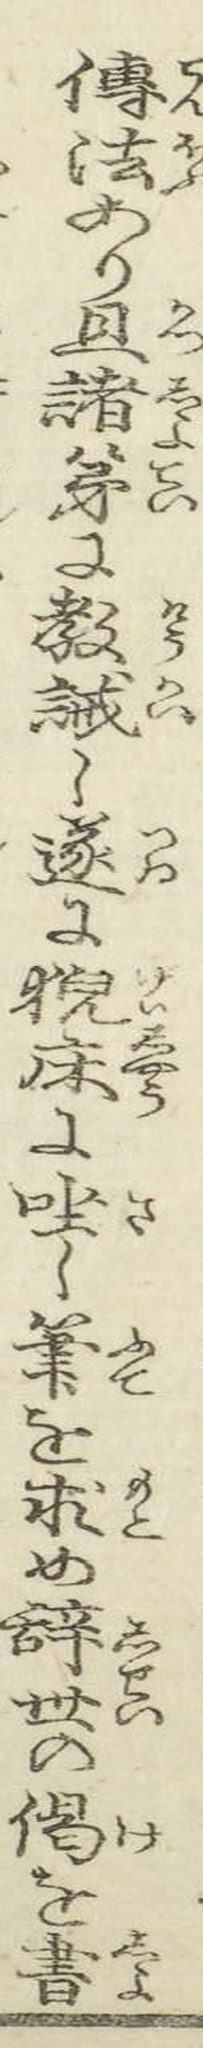伝法あり且諸弟に教誡し遂に猊床に坐し筆を求め辞世の偈を書
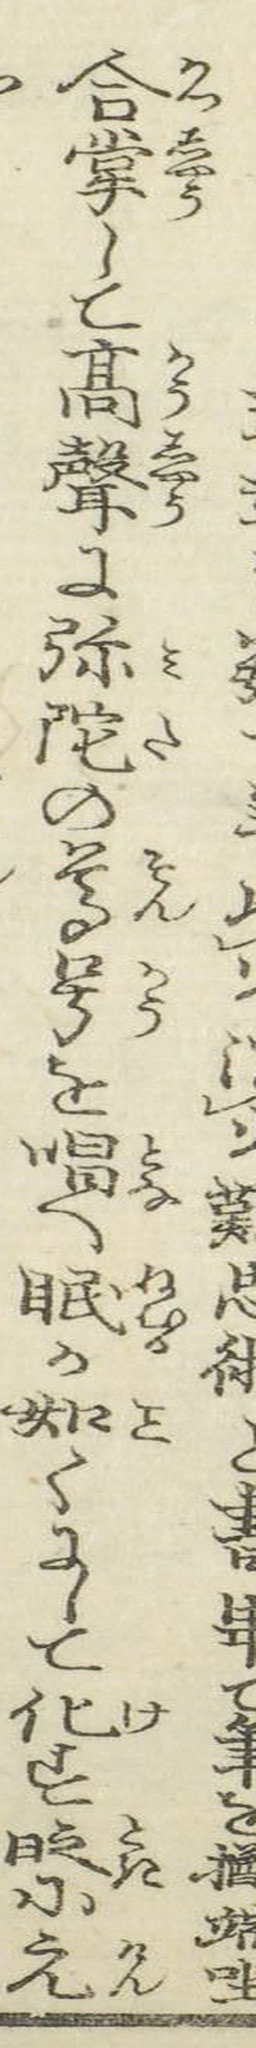合掌して高声に弥陀の尊号を唱へ眠か如くにして化すに元
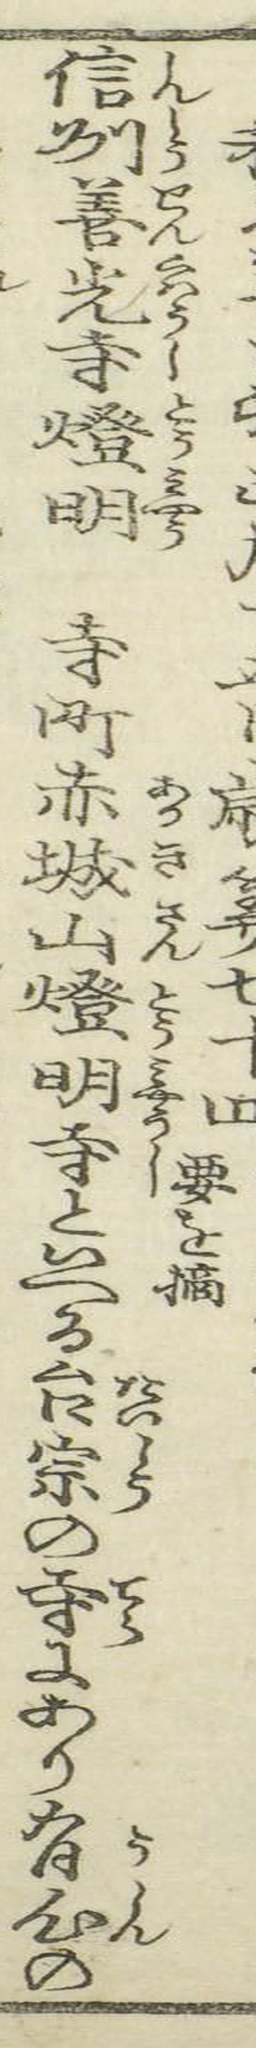信州善光寺燈明寺町赤城山燈明寺といへる台宗の寺にあり有心の
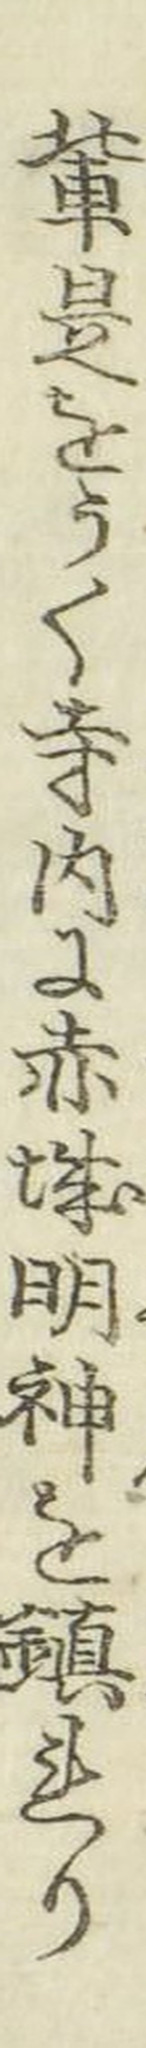輩是をうく寺内に赤城明神を鎮れり
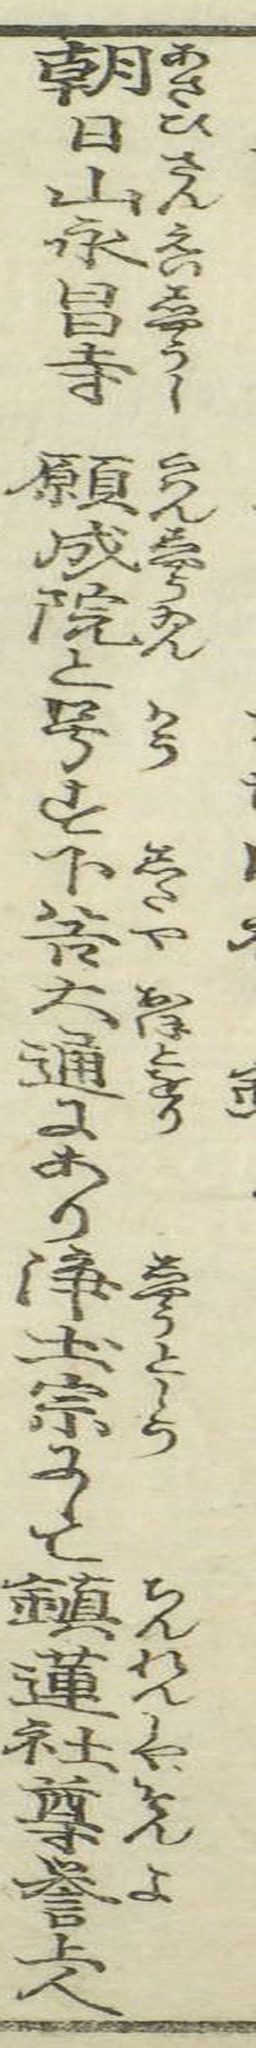朝日山永昌寺願成院と号す下谷大通にあり浄土宗にして鎮蓮社尊誉上人
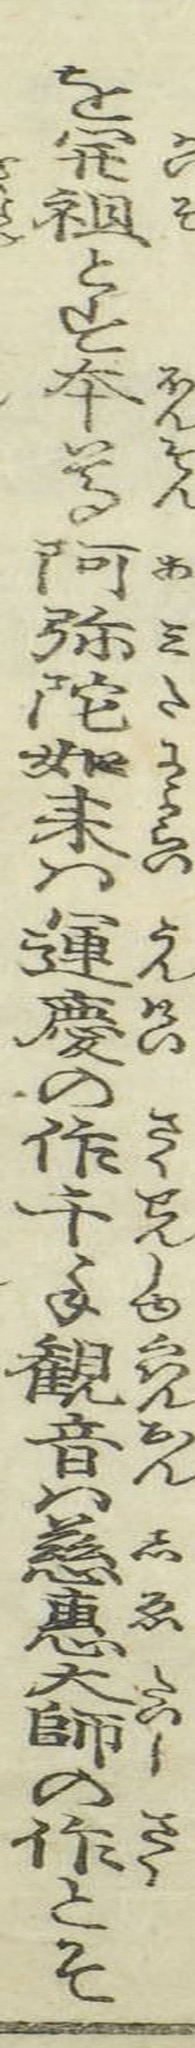を開祖とす本尊阿弥陀如来は運慶の作千手観音は慈恵大師の作とそ

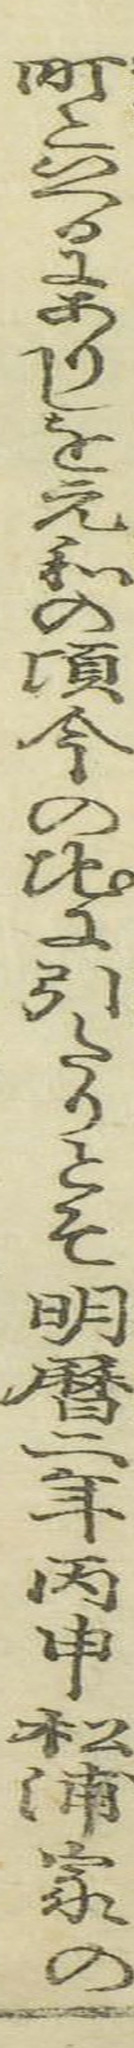町といへるにありしを元和の頃今の地に引たりとそ明暦二年丙申松浦家の
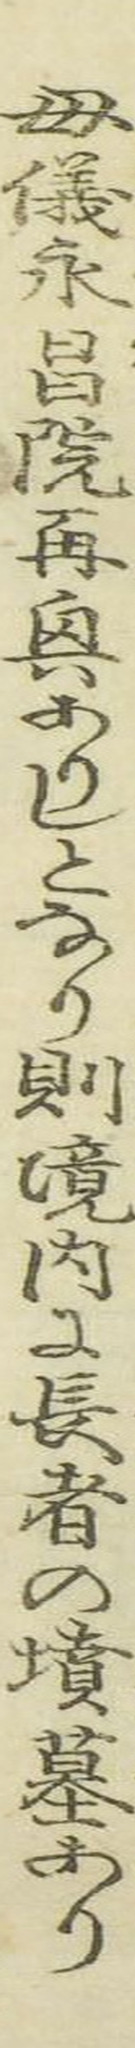母儀永昌院再興ありしとなり則境内に長者の墳墓あり
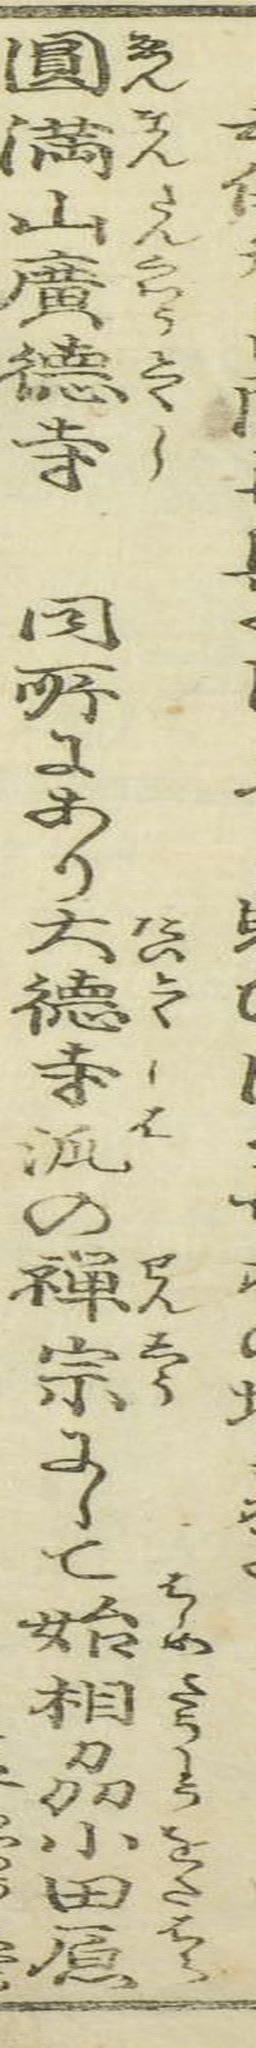円満山広徳寺同所にあり大徳寺派の禅宗にして始相州小田原
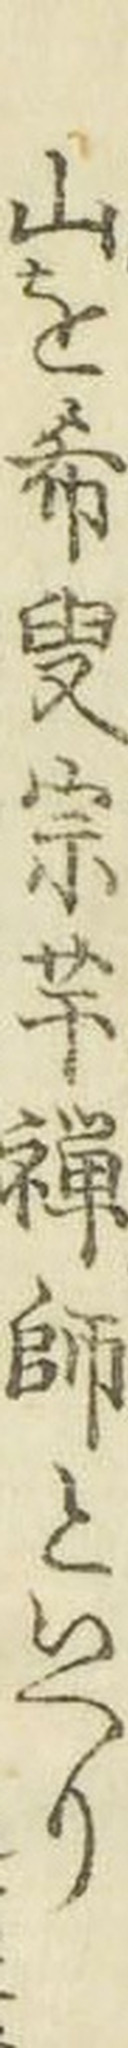山を希叟宗竿禅師といへり
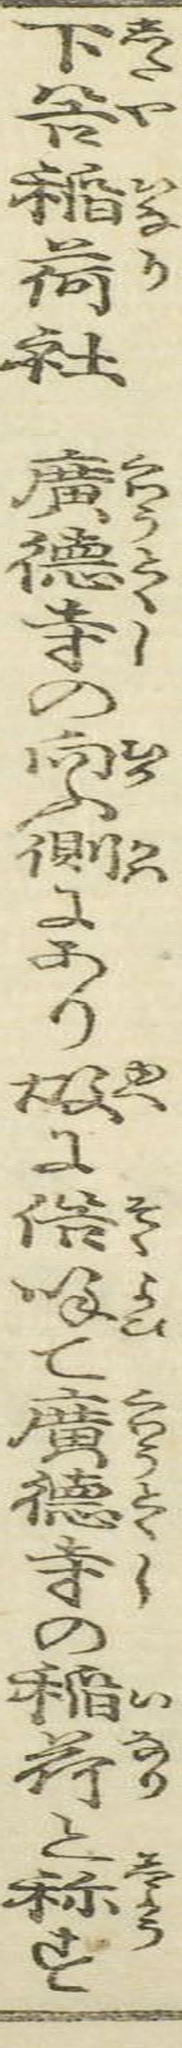下谷稲荷社広徳寺の向ふ側にあり故に俗呼て広徳寺の稲荷と称す
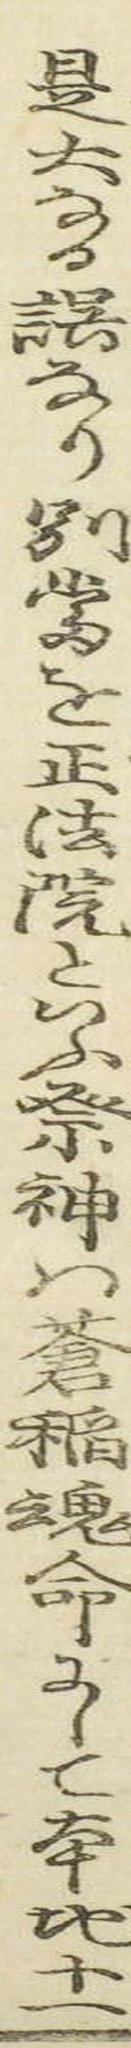是大なる誤なり別当を正法院といふ祭神は蒼稲魂命にして本地十一
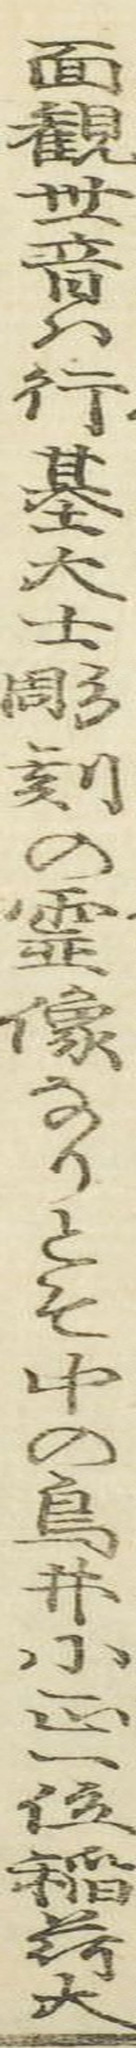面観世音は行基大士彫刻の霊像なりとそ中の鳥井に正一位稲荷大
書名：江戸名所図会 20巻 巻之16
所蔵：東京学芸大学教育コンテンツアーカイブ
